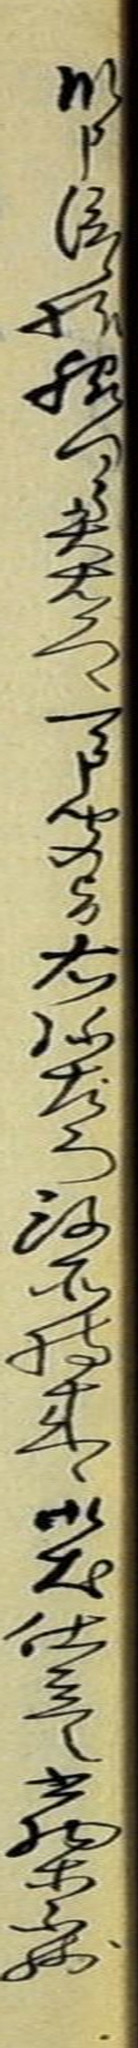段申渡候様脇田奥右衛門へ可申聞旨右弥左衛門役所持参候御犬仕立之書物等不残

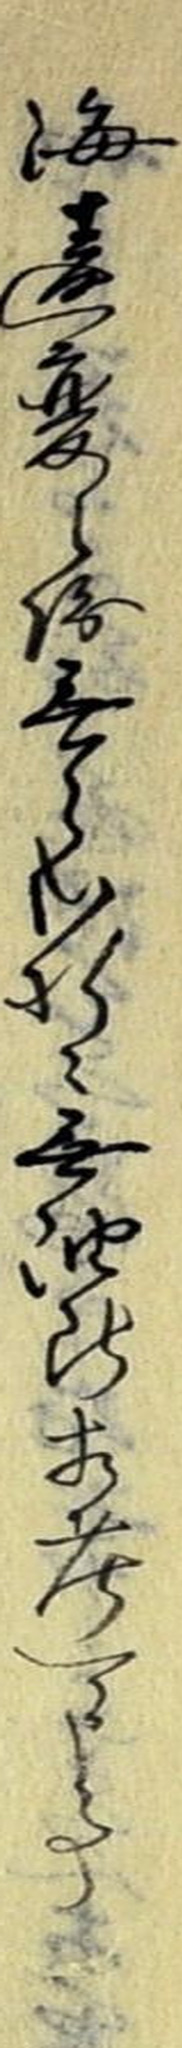海違変之儀無之哉折々無油断相考可申事
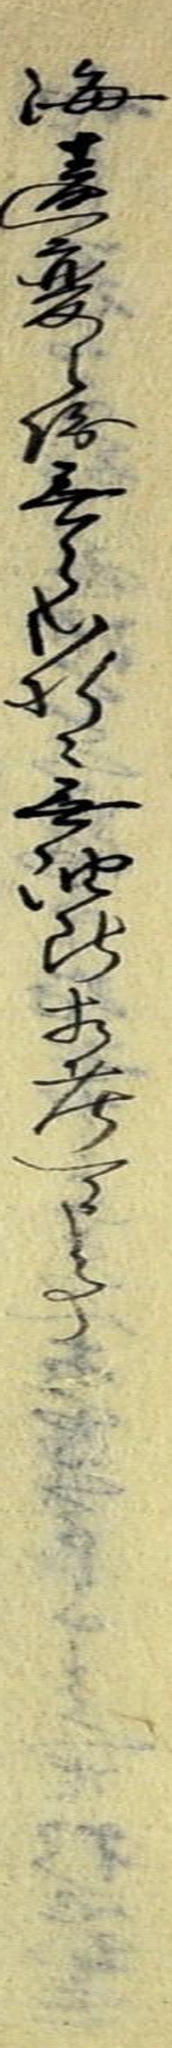海違変之儀無之哉折々無油断相考可申事
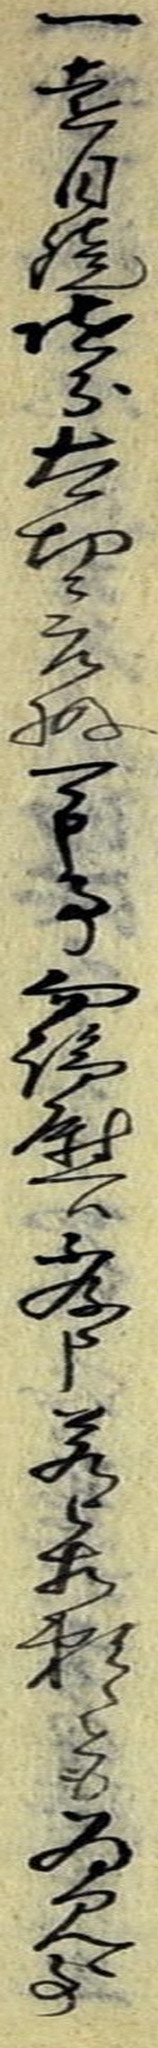一遠目鏡随分太切ニ取扱可申事勿論慰ハ不及申若被相頼候とも為見候事
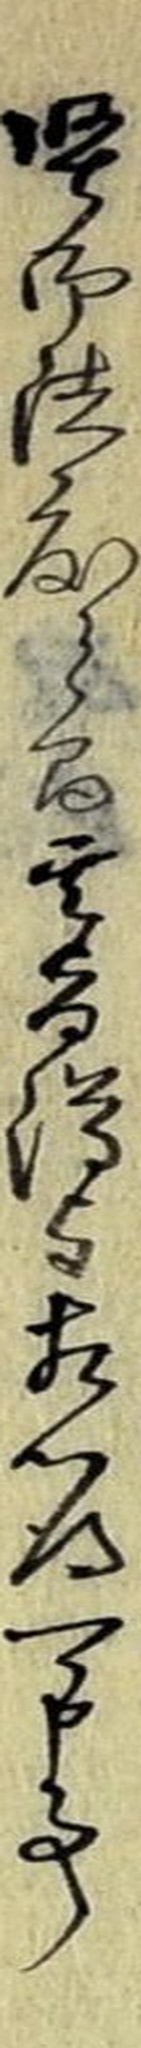堅御法度ニ候間其旨得与相心得可申事
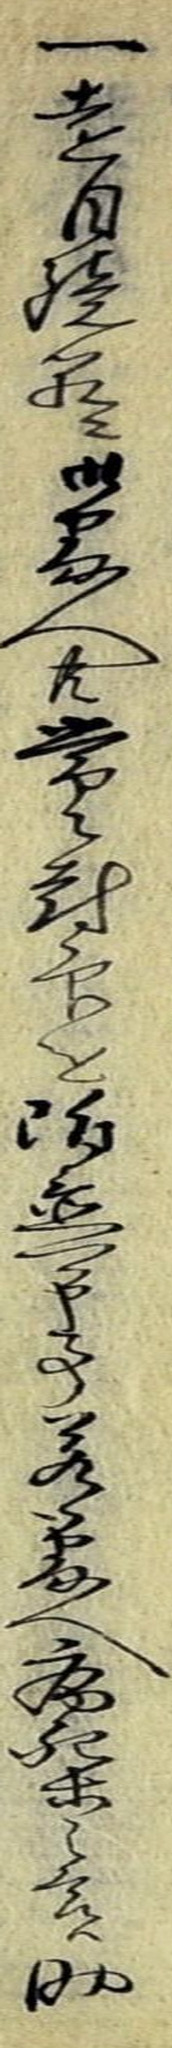一遠目鏡箱ニ御番人共常々封印を付置可申事若御番人病死等之節ハ助
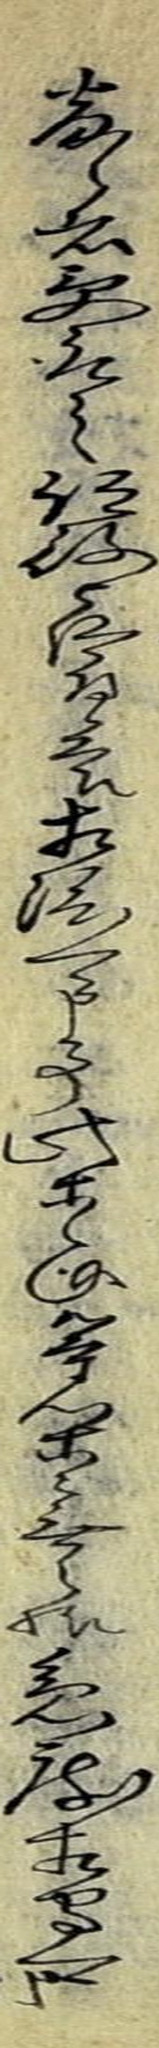番之者受取之跡役被仰付候節相渡可申事此等之趣等閑ニ無之様急度相守可申事
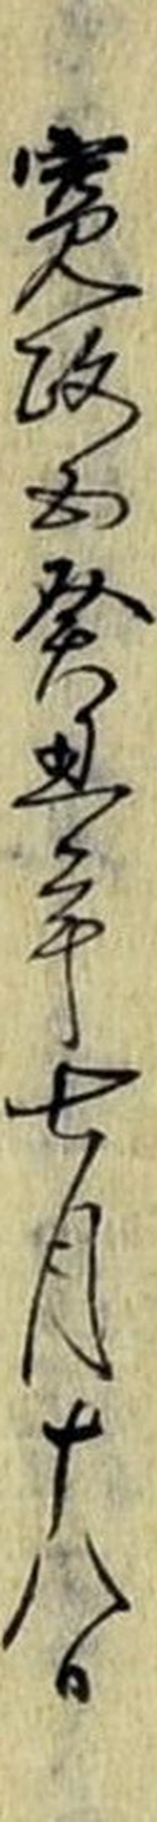寛政五癸丑年七月十八日
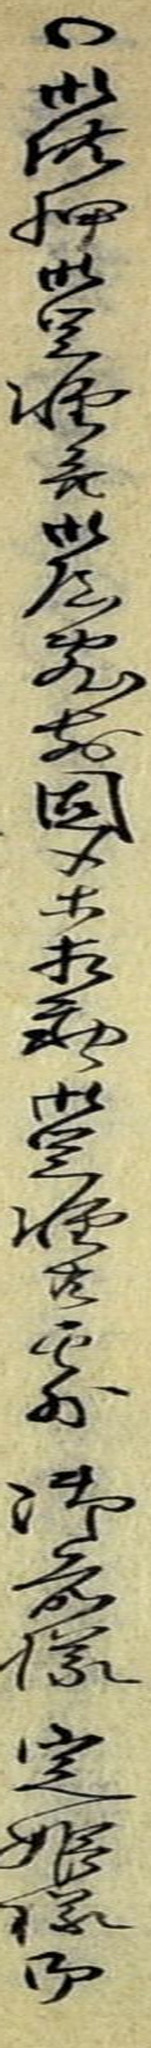〇御供押御足軽并御屋敷前固メ等相勤候御足軽共其外御前様定姫様御
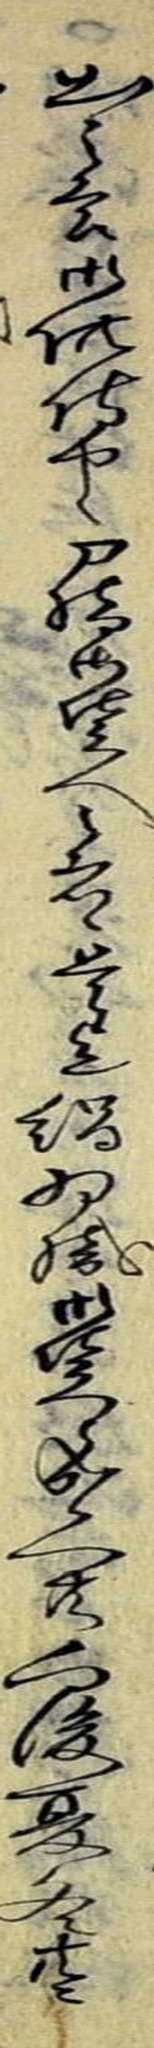出之節御供侍中へ刀指御貸人之者へ是迄絹羽織御貸被成候へ共向後夏冬共ニ
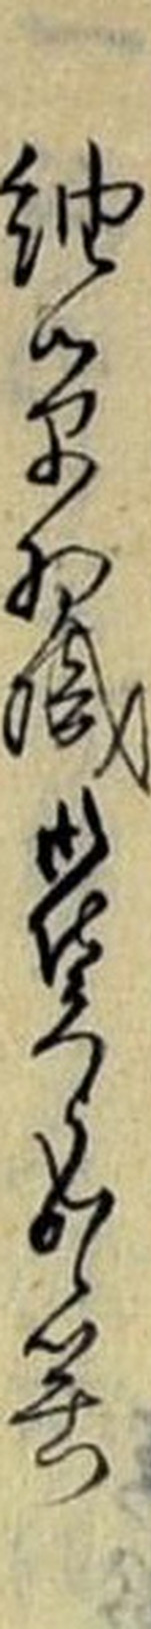紬単羽織御貸被成候筈
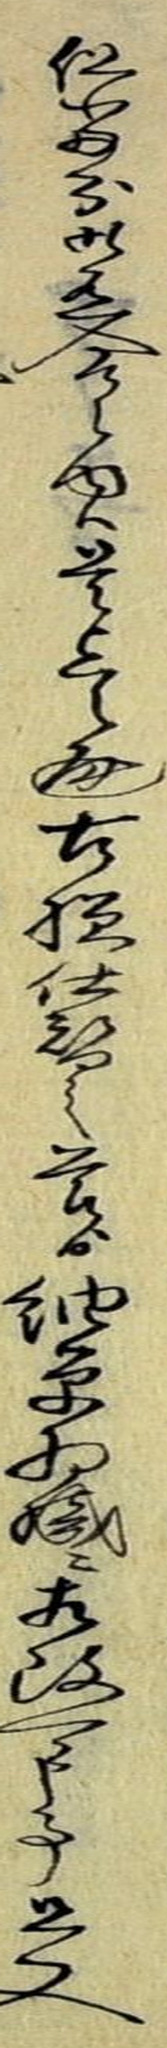但当分御有合之内ハ是迄之通古損仕替之節ゟ紬単羽織ニ相改可申事且又
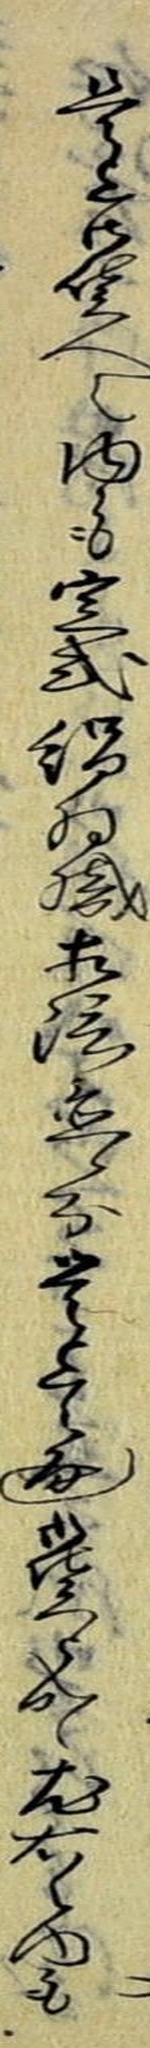是迄御貸人之内ニも定式絹羽織相渡置候分是迄之通御貸被成候尤右之内ニも
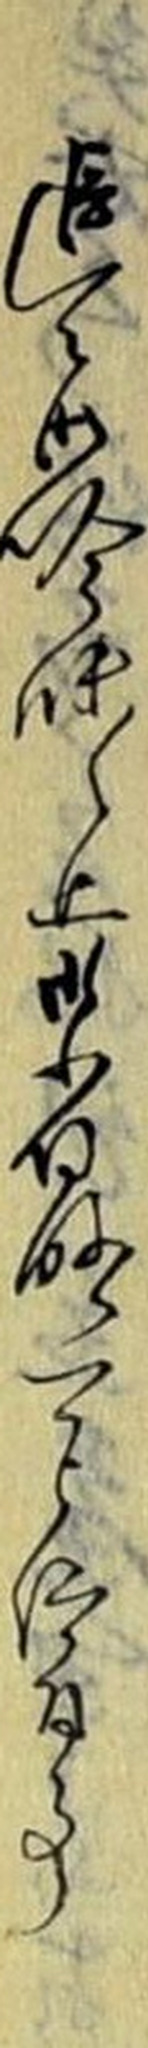追々御吟味之上御省略可被仰付事
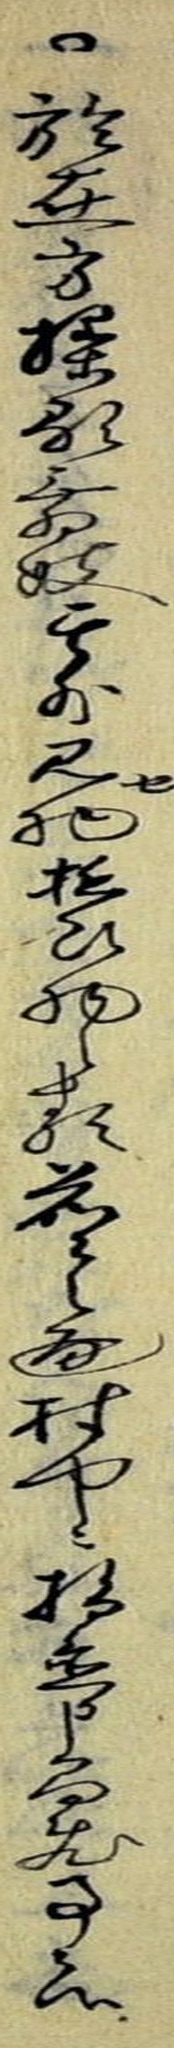〇於在方操歌舞妓其外見セ物遊ひ物之類前々之通村中ニ指置申間敷事ニ候
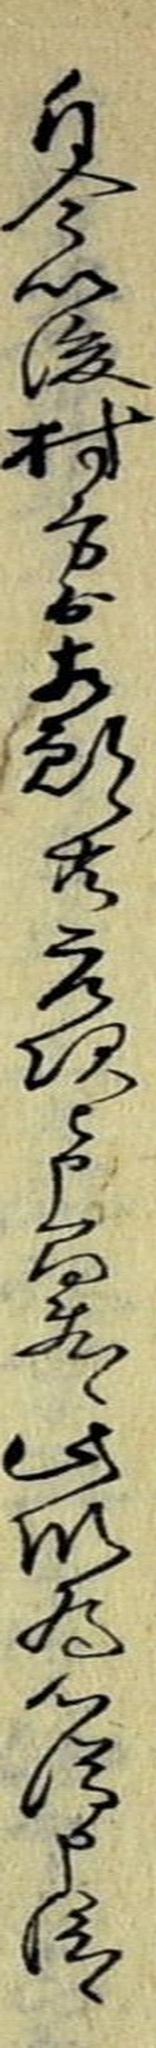自今以後村方ゟ相願候共取次被申間敷候此段為心得申渡候
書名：命令之部 三
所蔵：福井県文書館 Fukui Prefectural Archives
